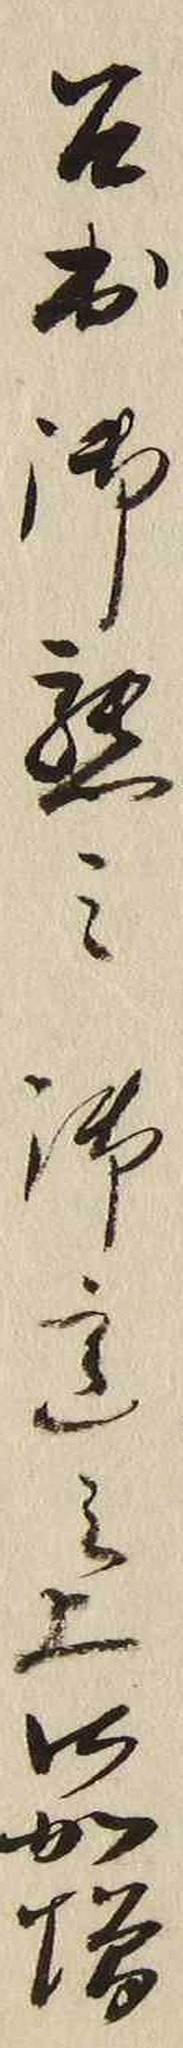召出御懇之御意之上御加増
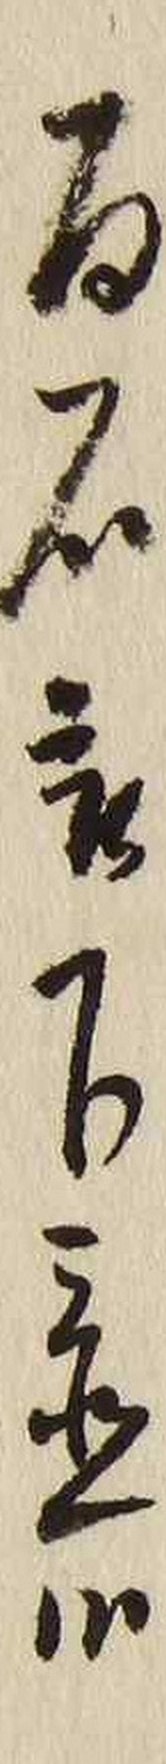百石被下置候

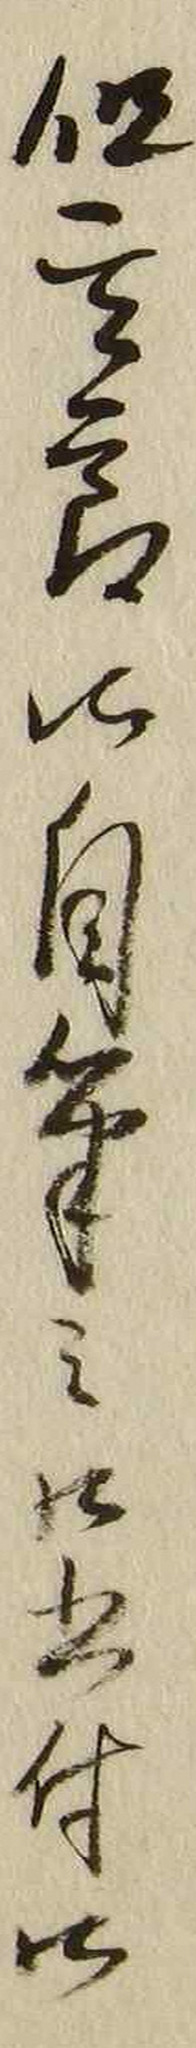但其節御自筆之御書付御
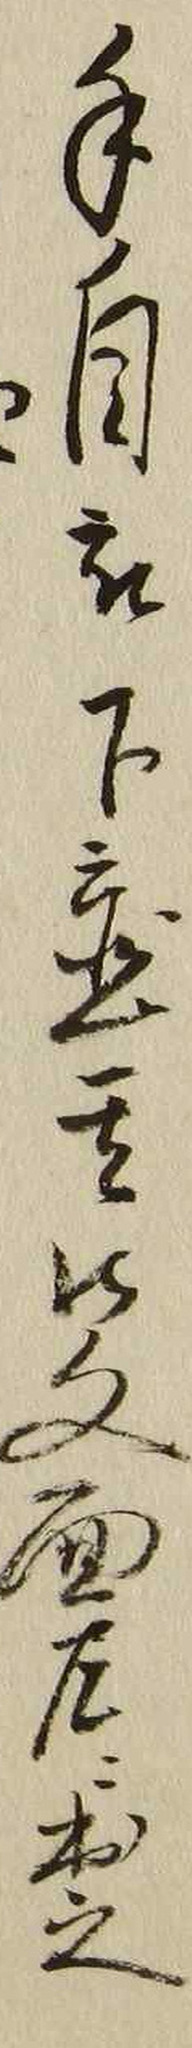手自被下置其御文面左ニ出之
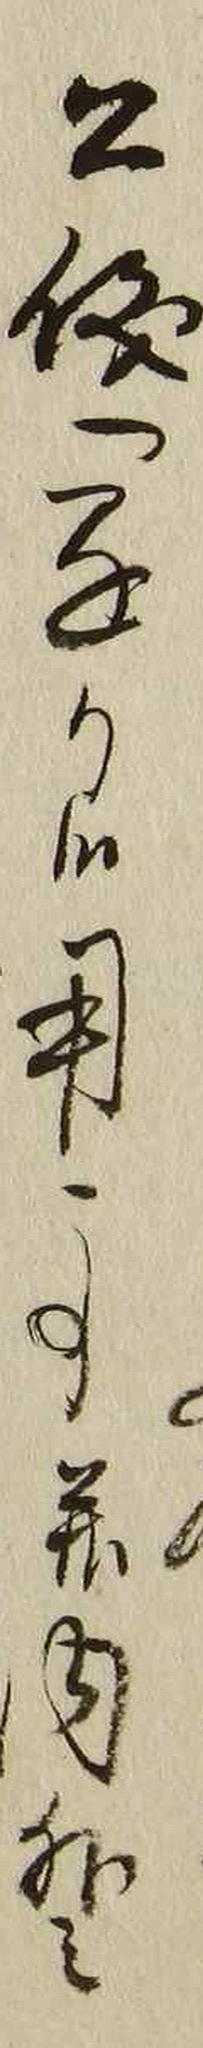公儀へ懸り候用事并内外之
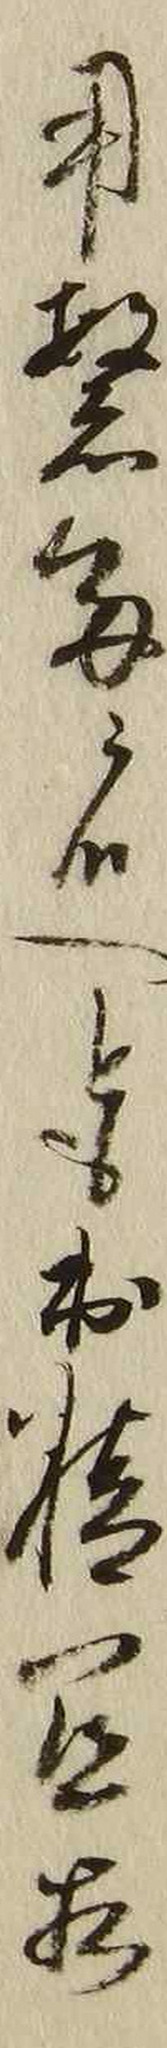用繁多ニ候へとも出精宜相
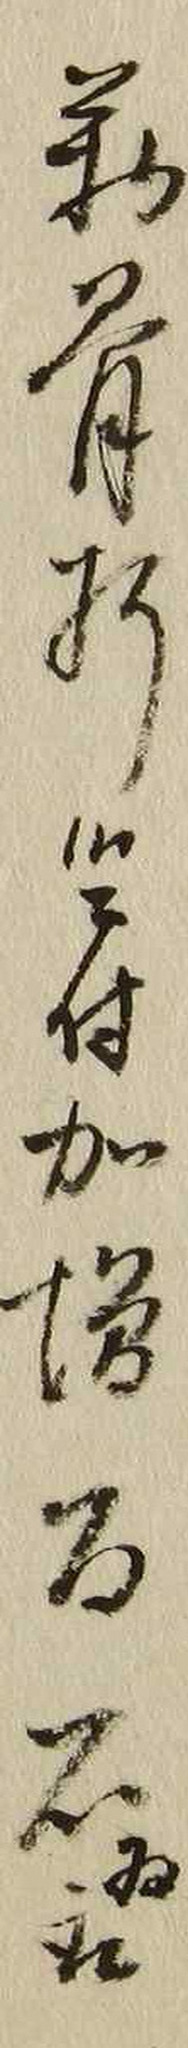勤骨折候ニ付加増百石為取
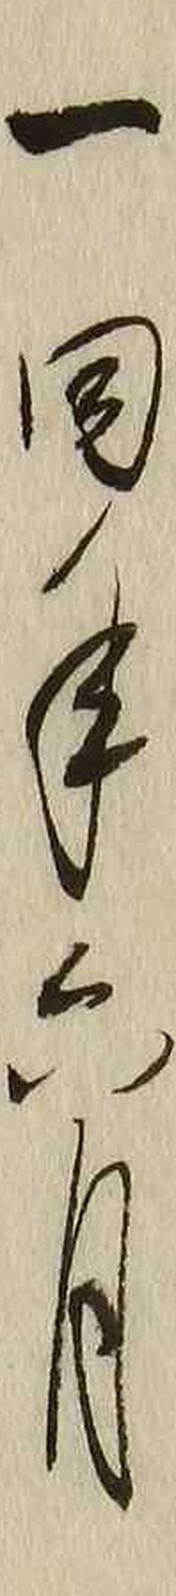一同年六月
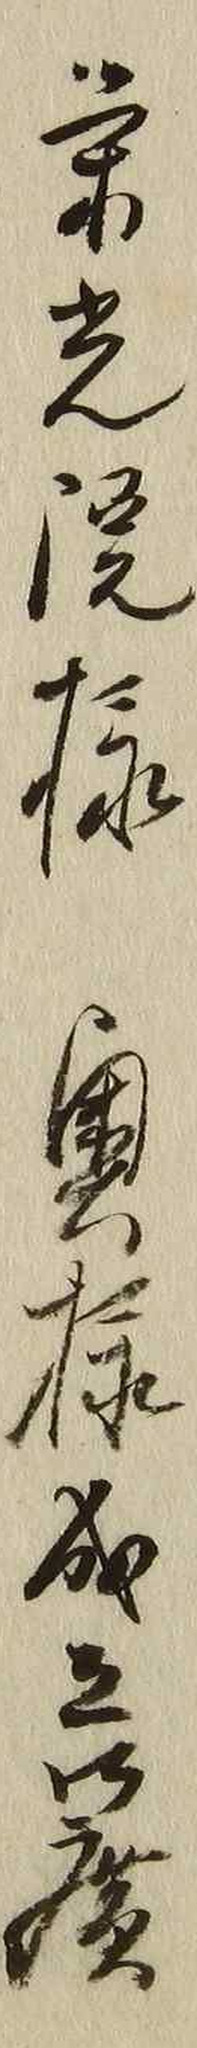栄光院様奥様成立御広
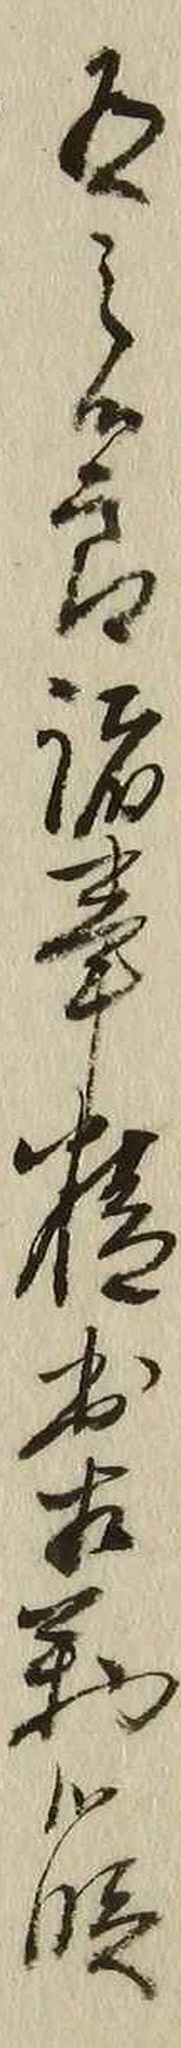有之候節諸事精出相勤候段
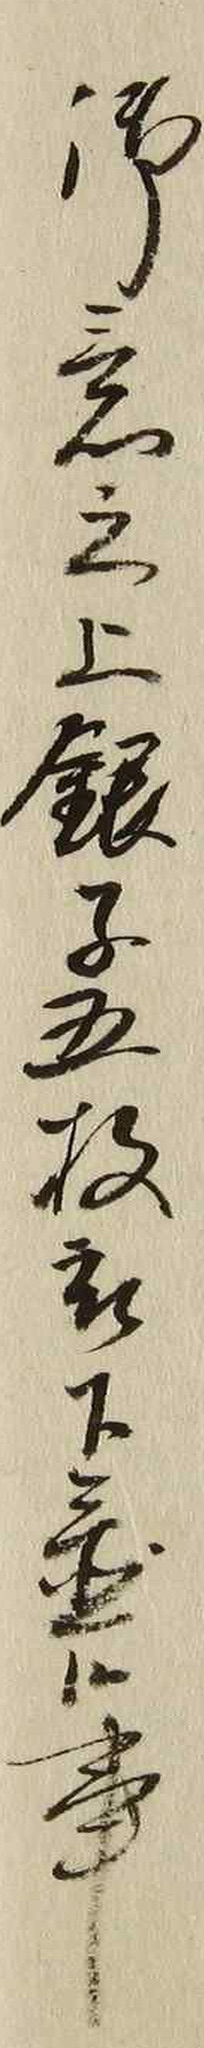御意之上銀子五枚被下置候事
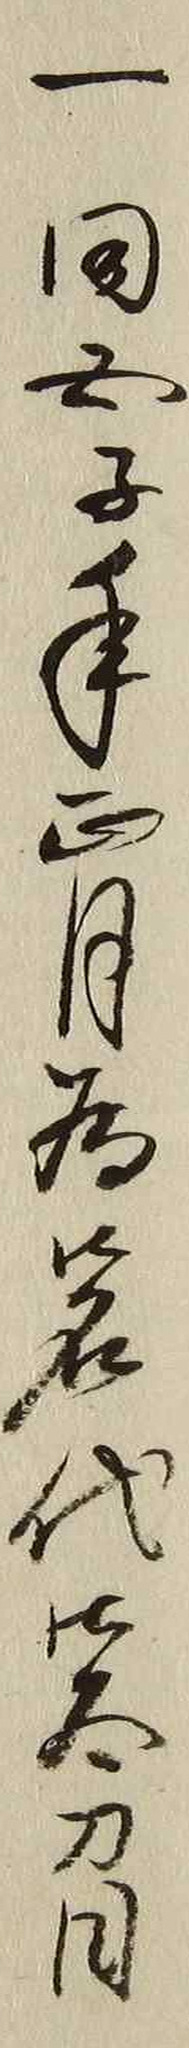一同五子年正月為御名代御太刀目
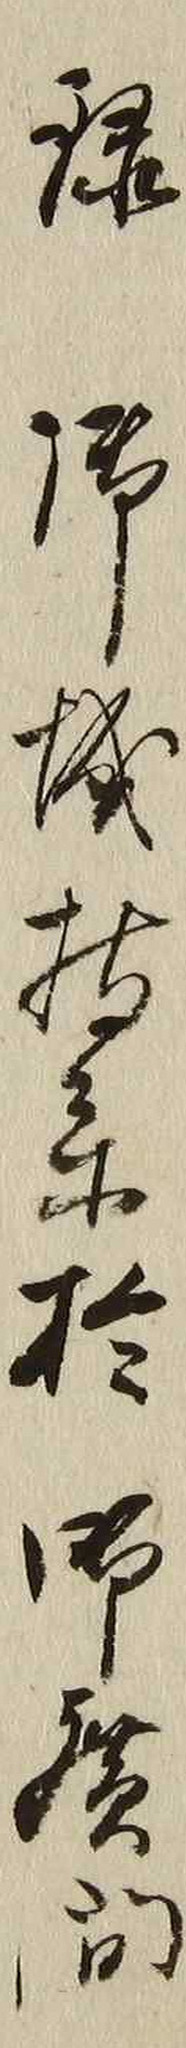録御城持参於御広間
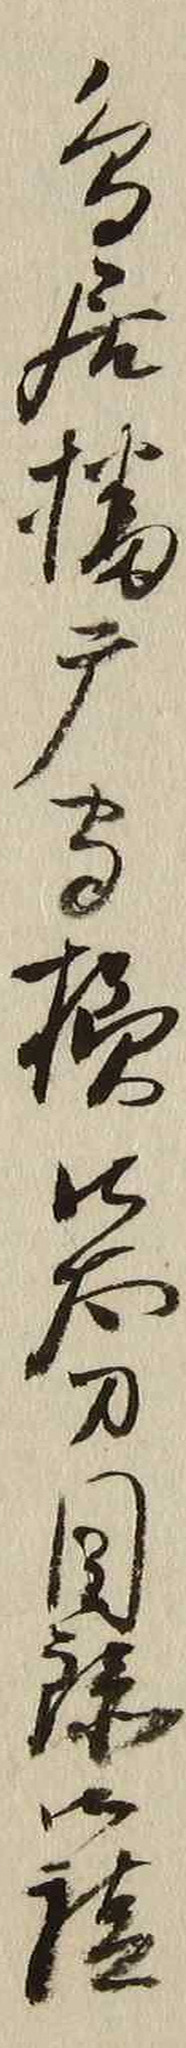鳥居播磨守様御太刀目録御請
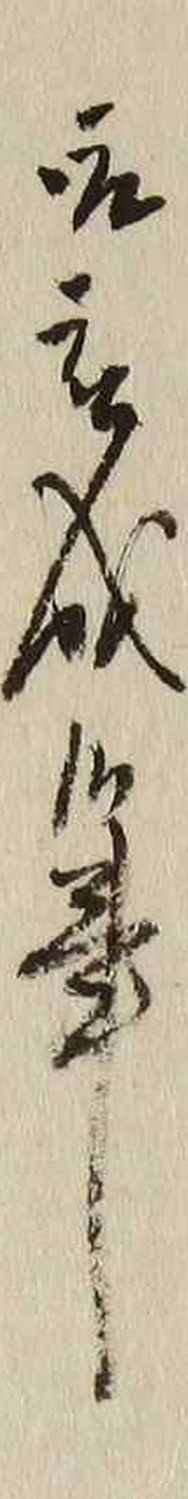取被成候事
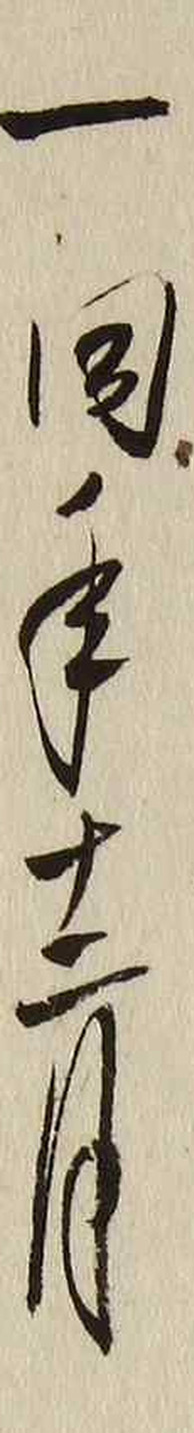一同年十二月
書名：諸士系譜　巻之351　す之部1
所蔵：会津若松市立会津図書館
